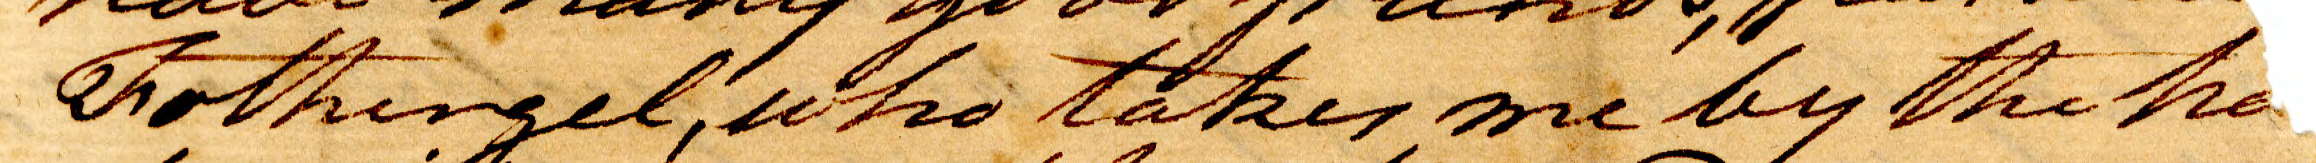Fothergel, who takes me by the ha
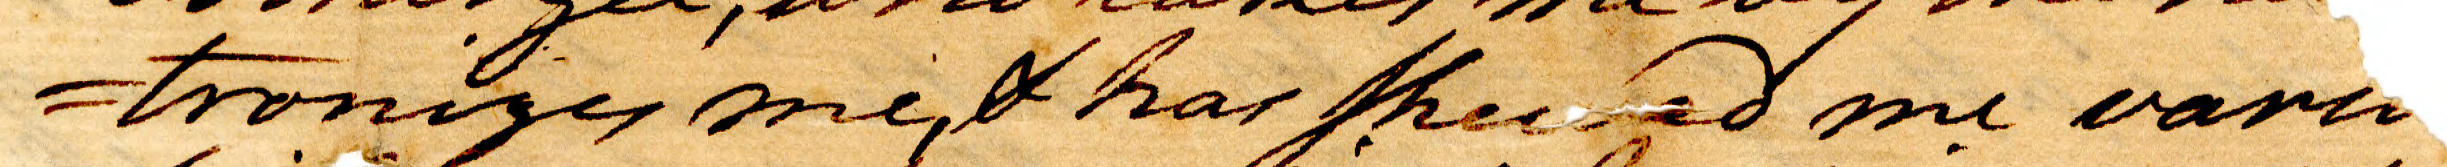-tronizes me, & has shewed me var
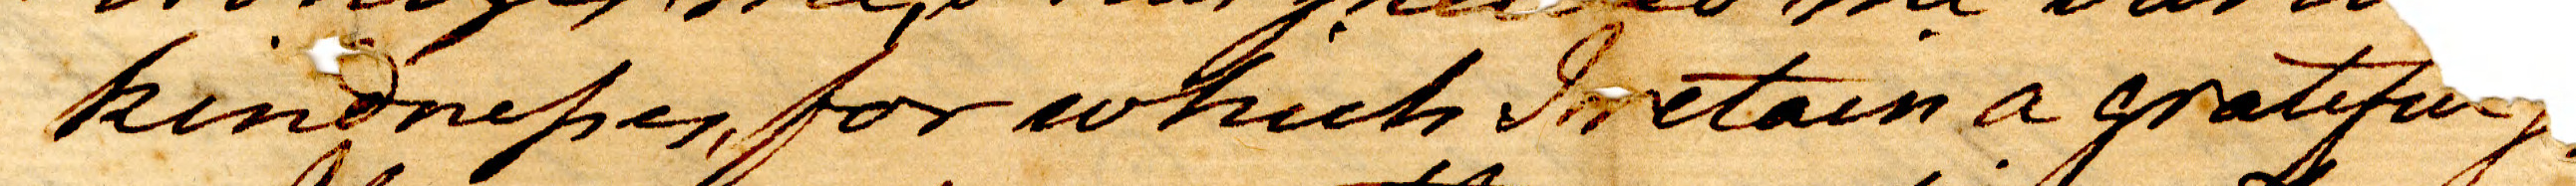kindness, for which I retain a gratefu
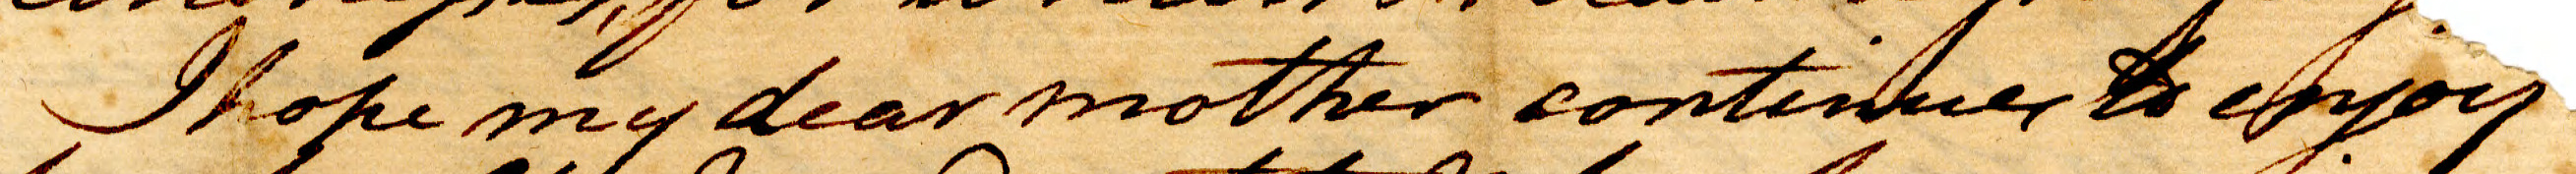I hope my dear mother continues to enjoy
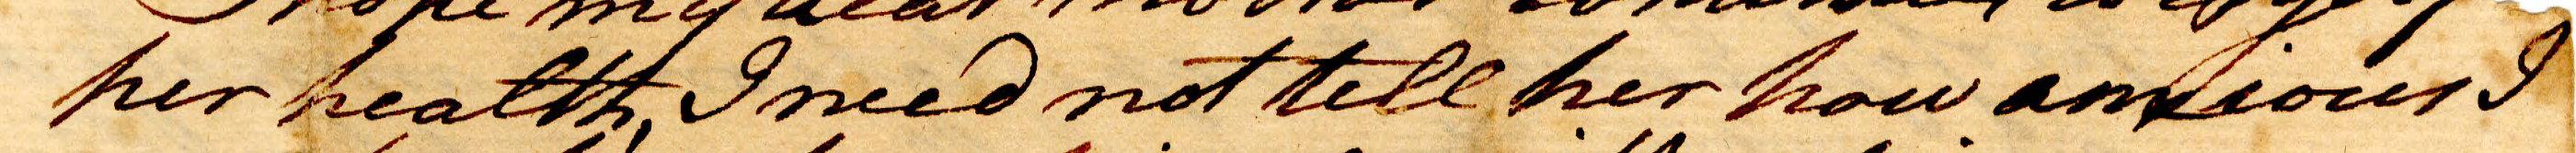her health, I need not tell her how anxious I
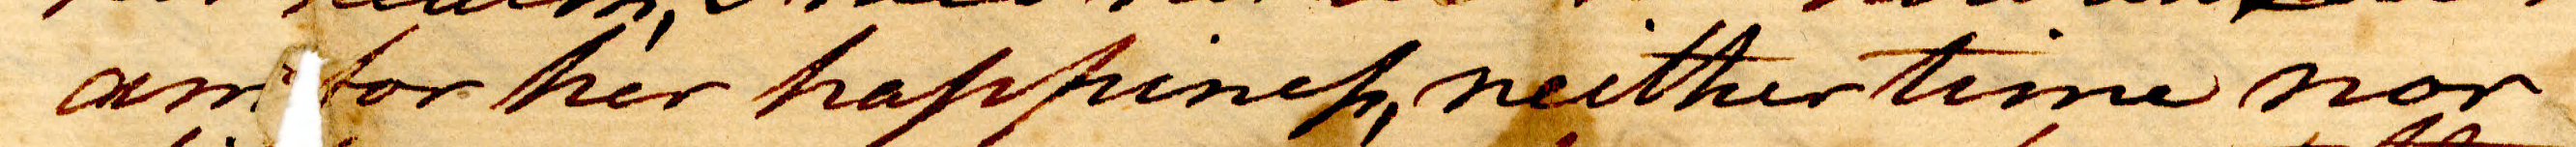am for her happiness, neither time nor
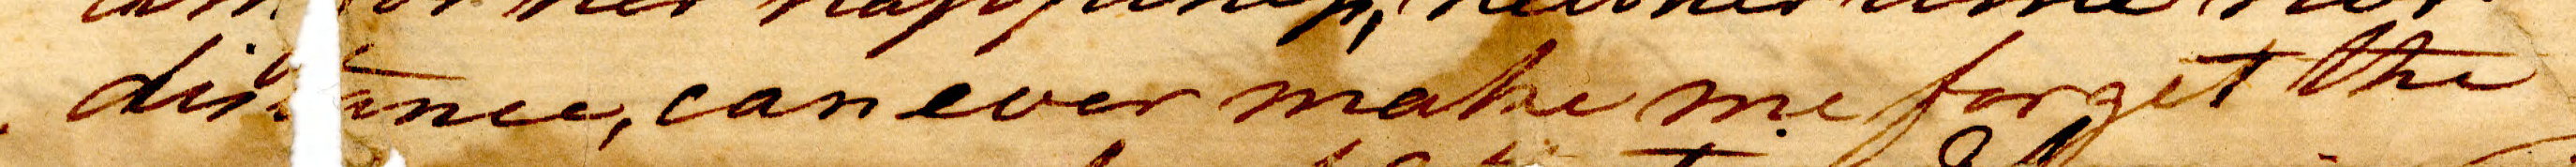distance, can ever make me forget the
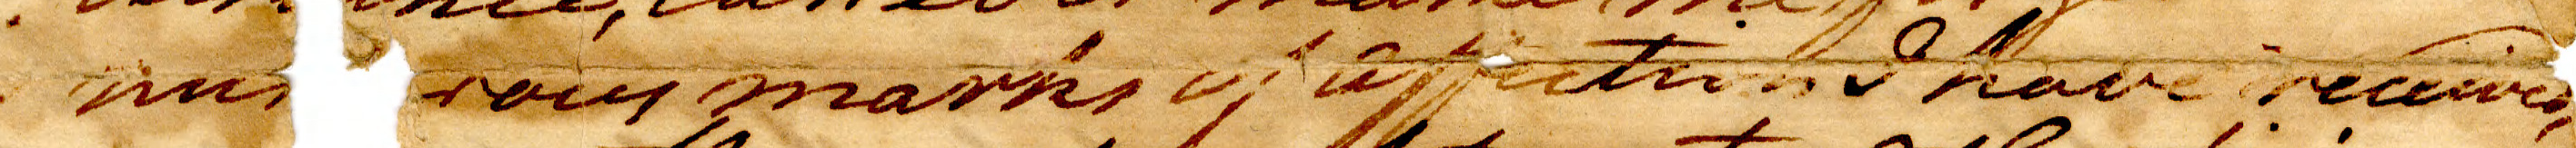nu[__]rous marks of affection I have received,
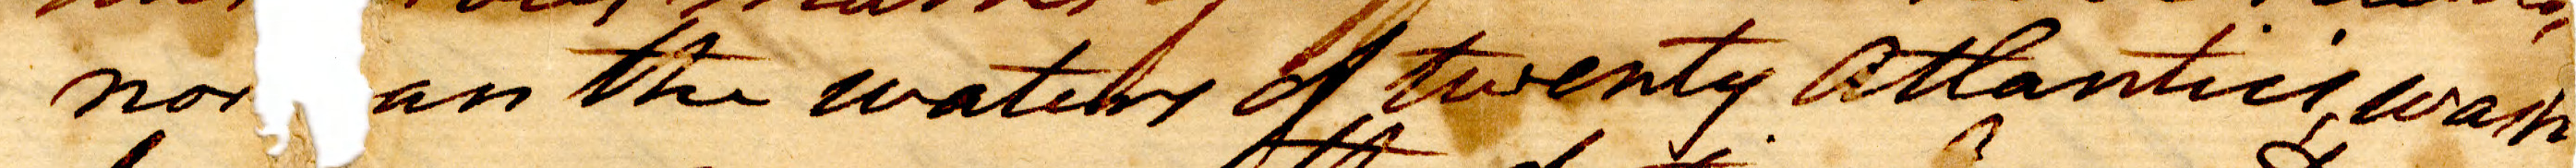nor [_]an the waters of twenty Atlantics wash
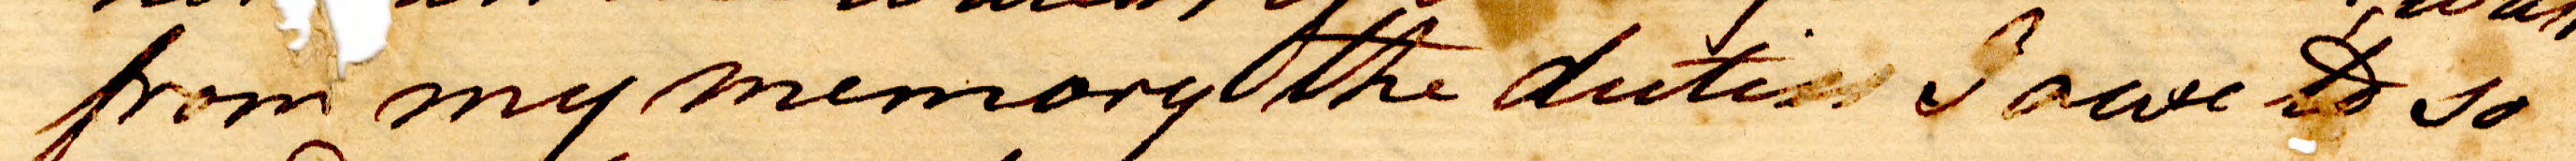from my memory the duties I owe to so
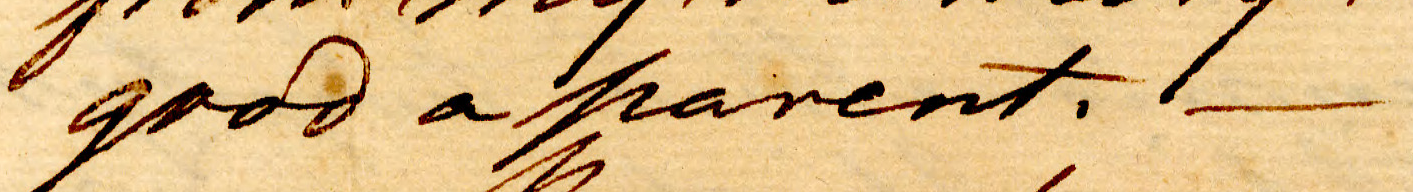good a parent.-
